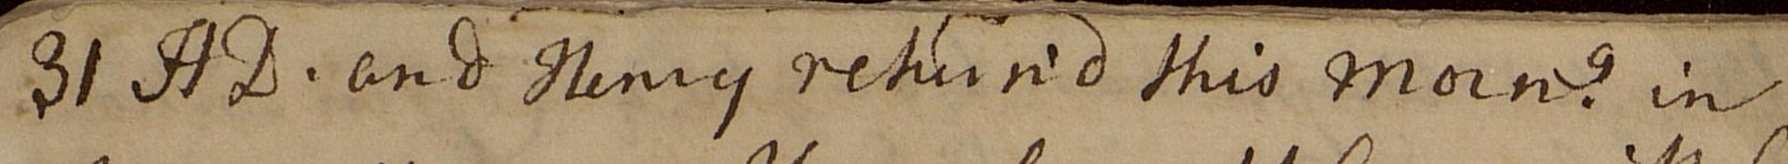31 HD and Henry return'd this morn^g in
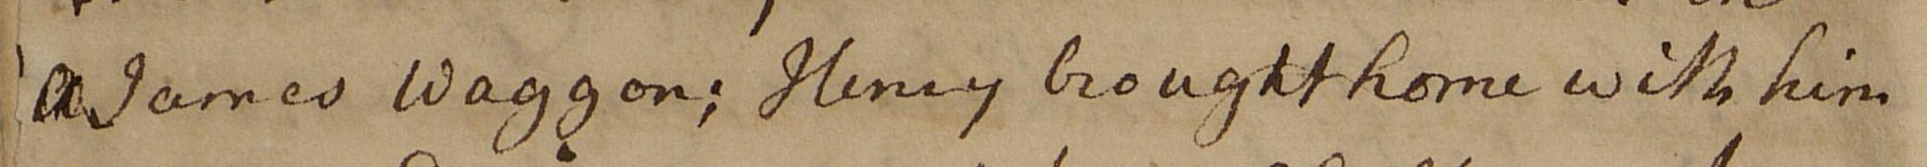A James Waggon; Henry brought home with him
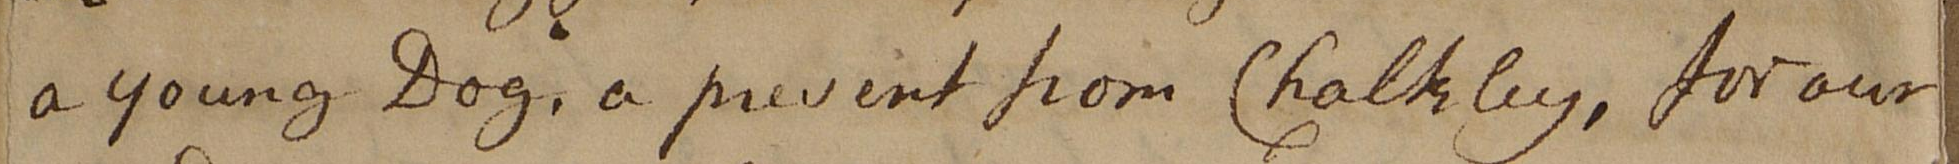a young Dog. a present from Chalkley, for our
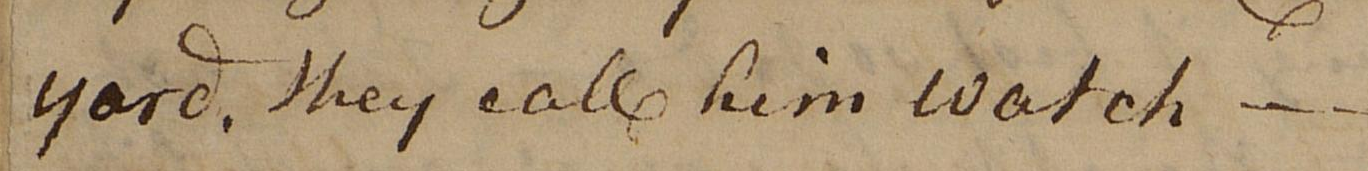yard, they call him Watch-
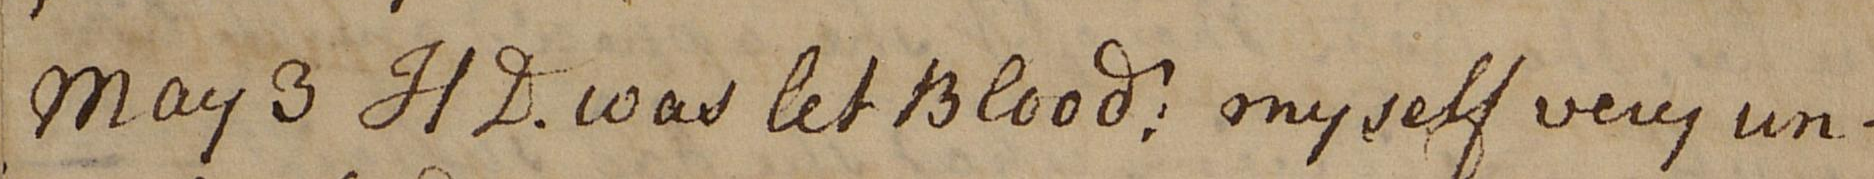May 3 HD. was let Blood; myself very un-
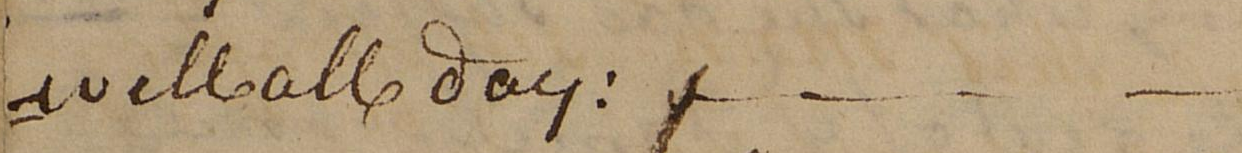-well all day:---
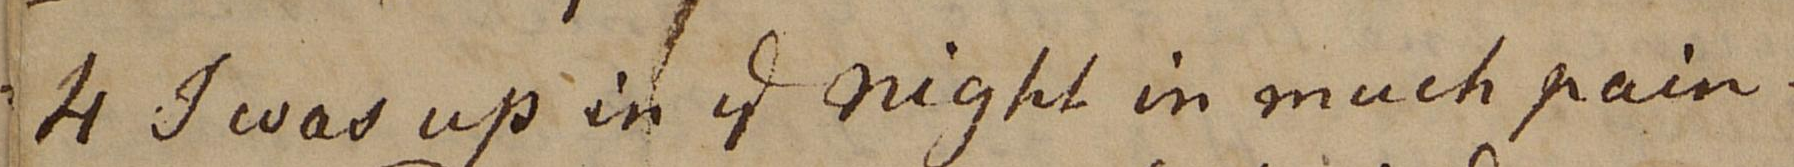4 I was up in y^e night in much pain
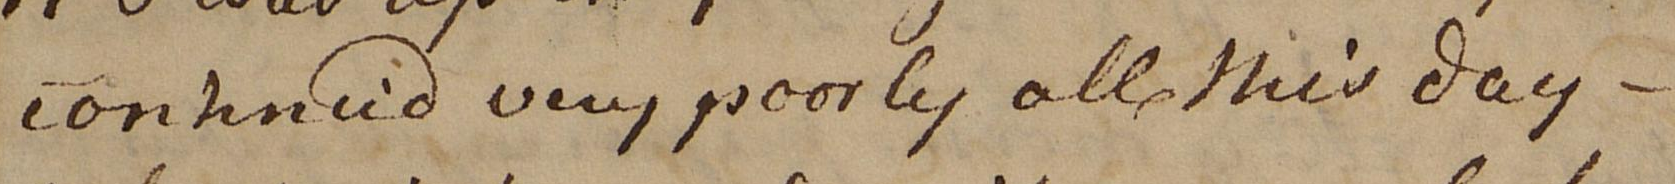continu'd very poorly all this day-
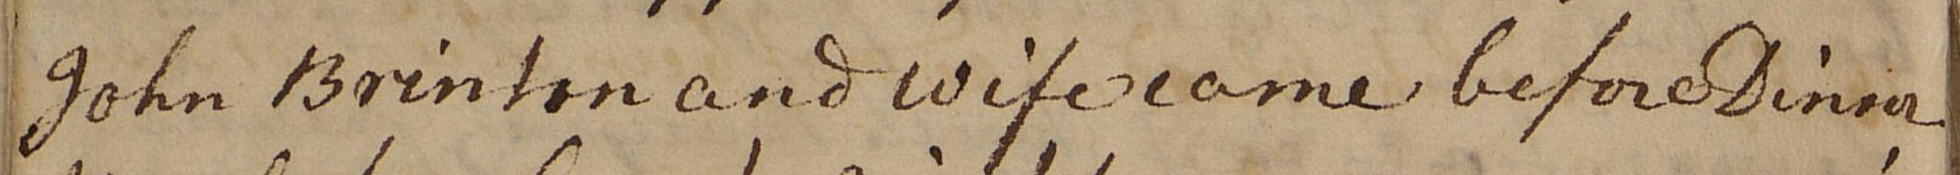John Brinton and Wife came before Dinner,
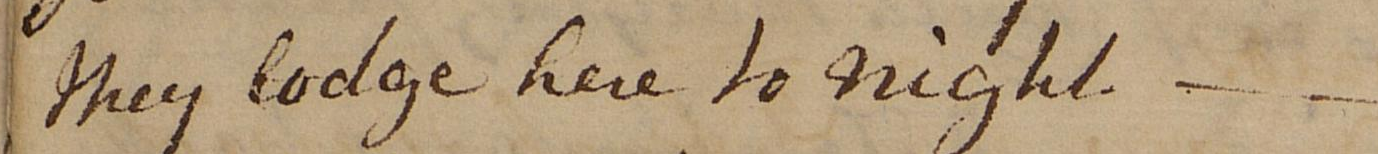they lodge here to night--
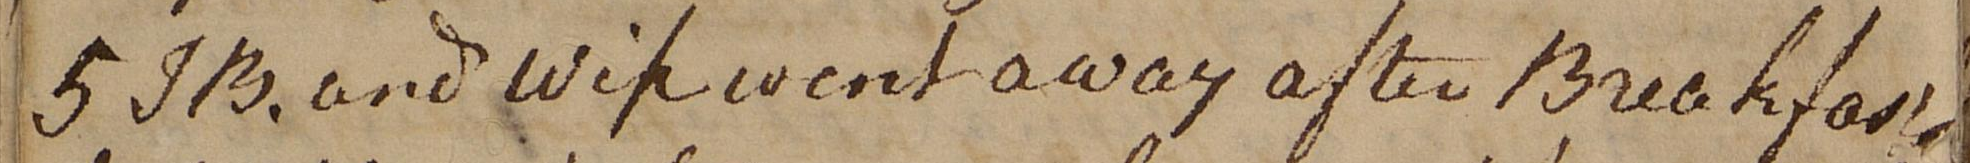5 JB. and Wife went away after Breakfast
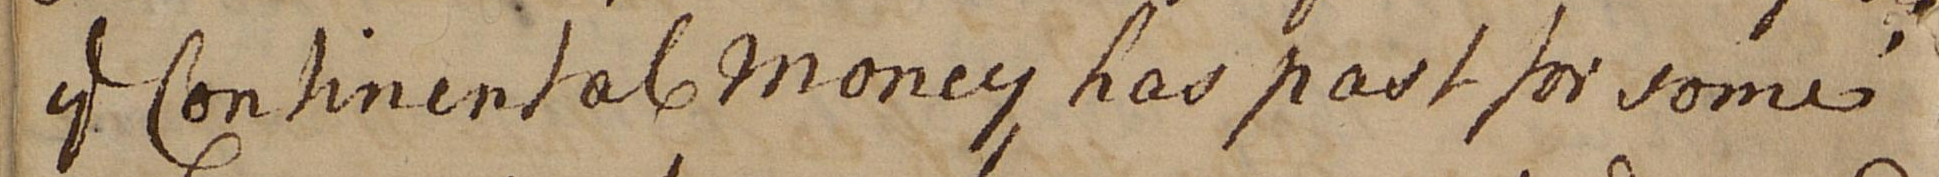y^e Continental money has past for some
